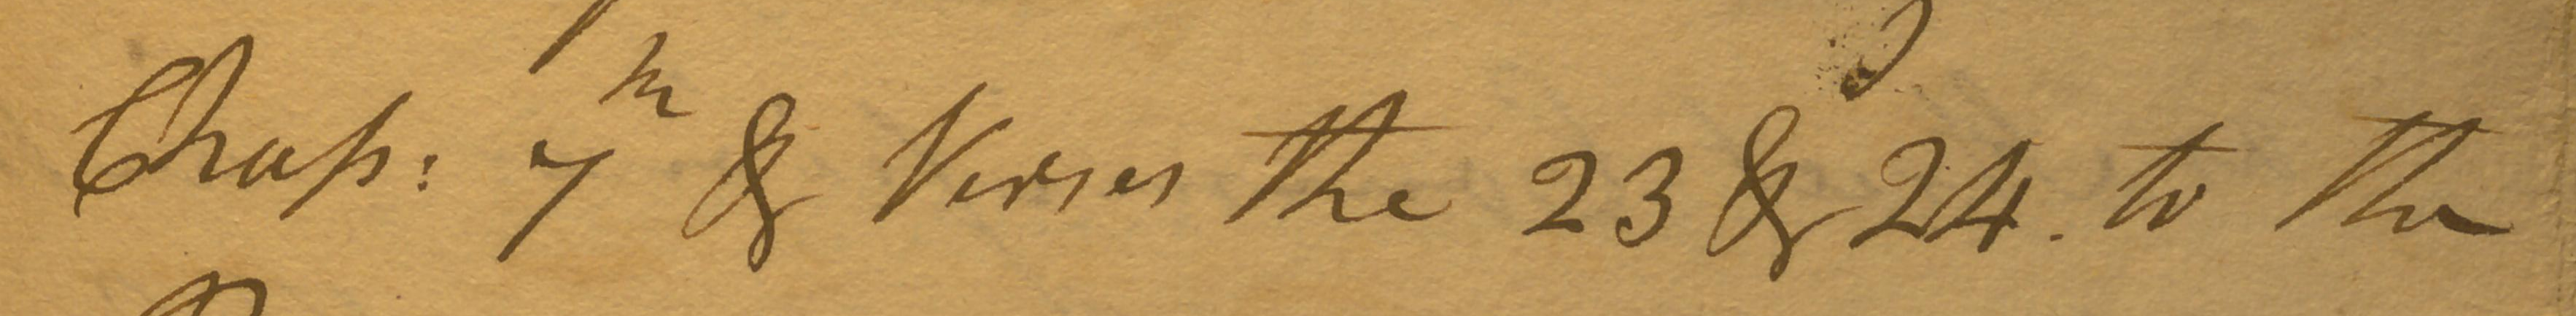Chap. 7^th & Verses the 23 & 24th. to the
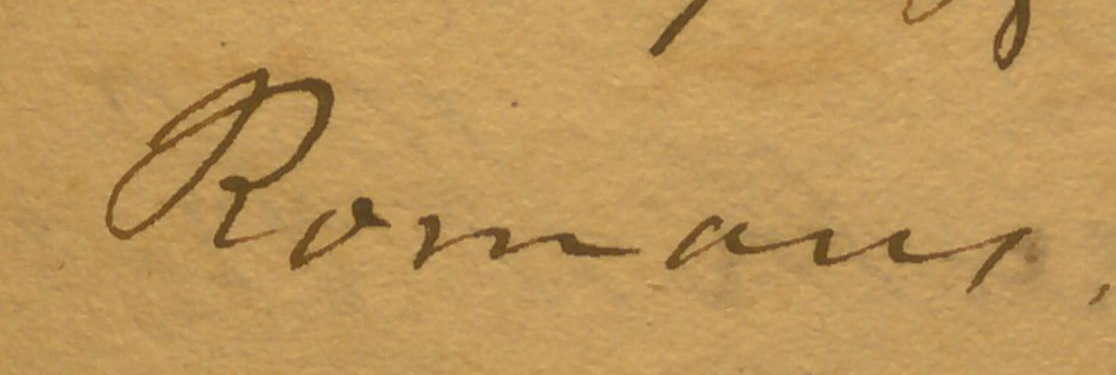Romans
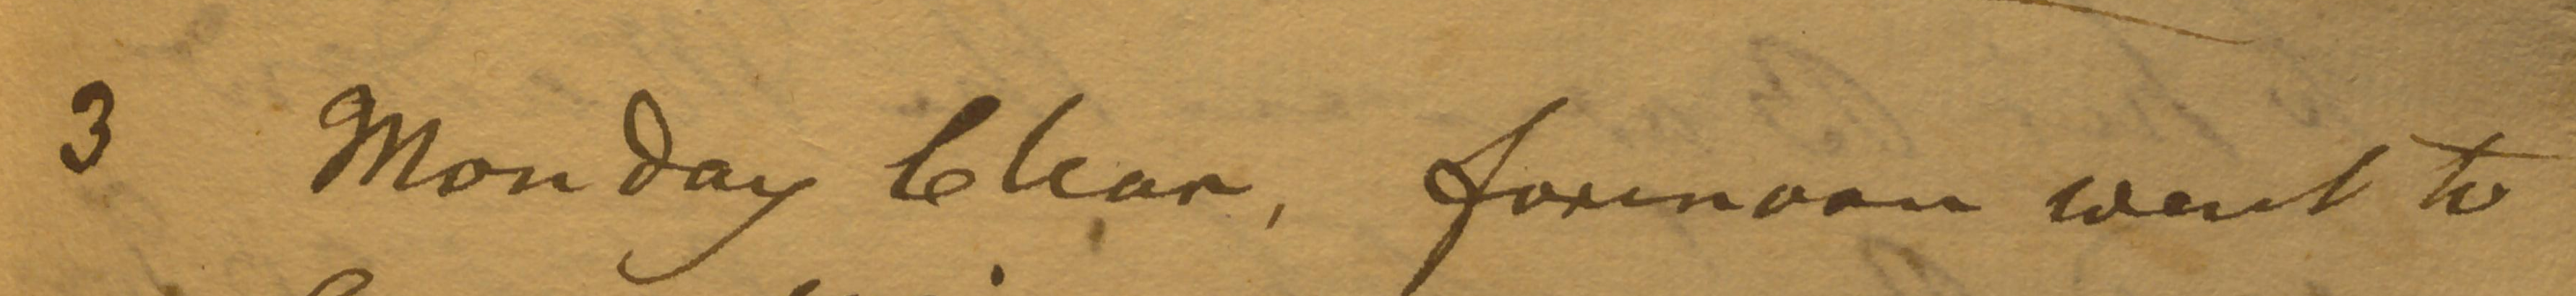3 Monday Clear, forenoon went to
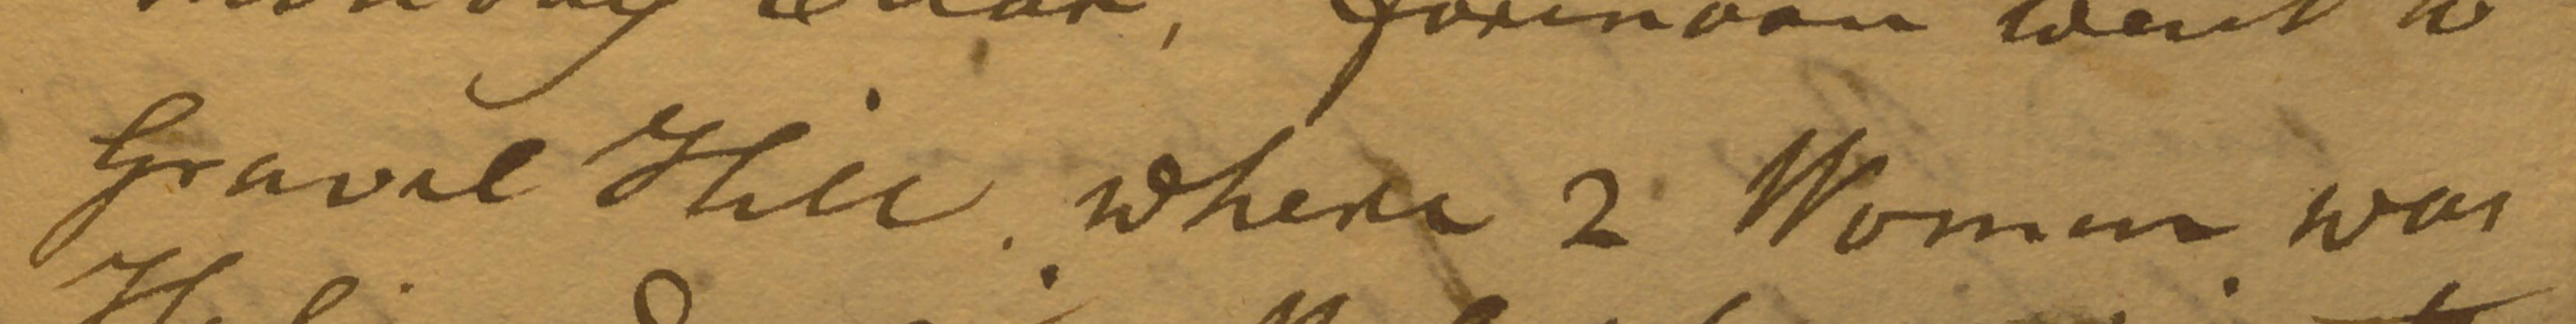Gravel Hill where 2 Women was
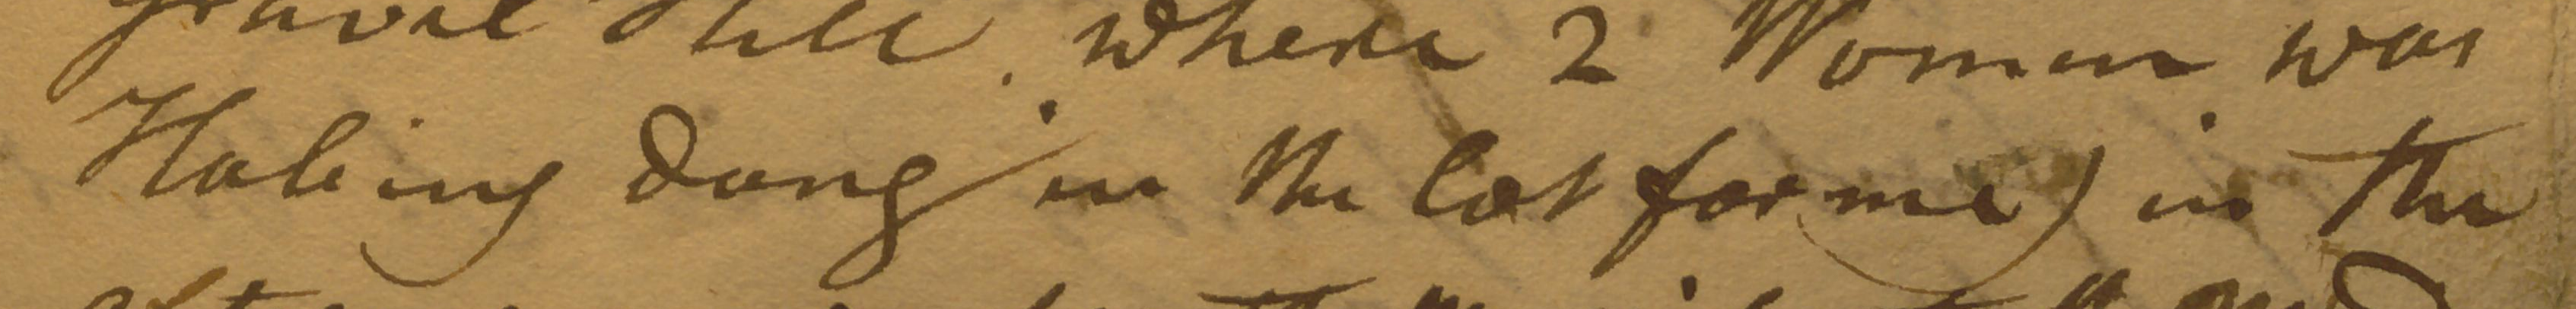Haling dung in the lot for me) in the
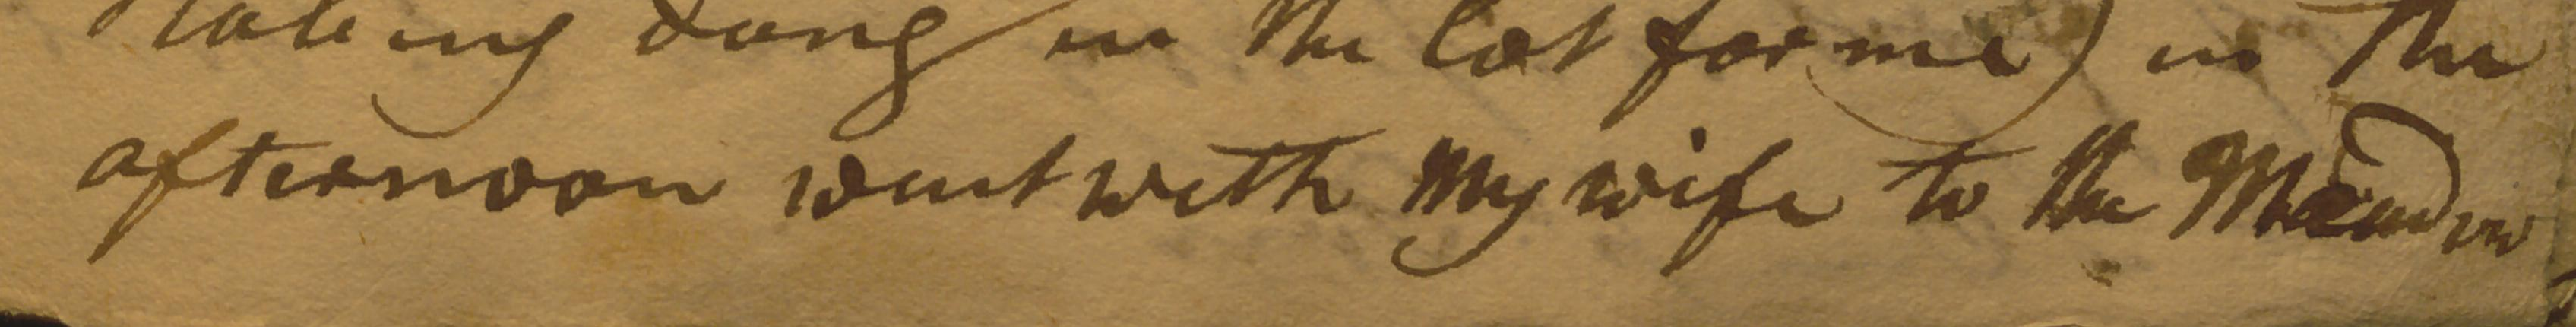afternoon went with My wife to the Meadow
